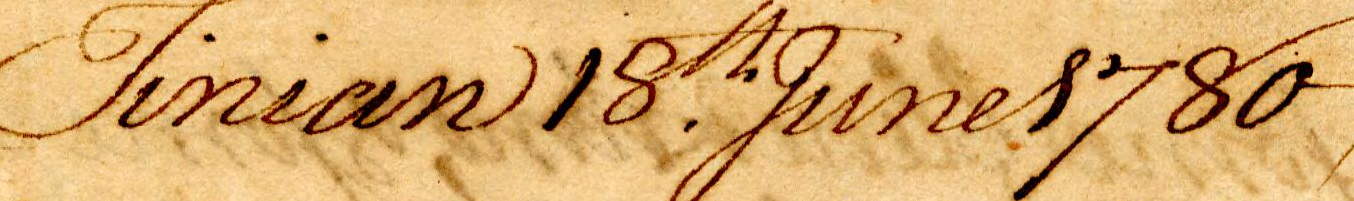Tinian 18^th. June1780
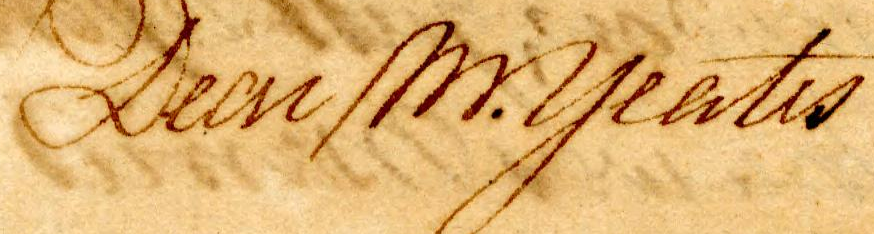Dear M. Yeates
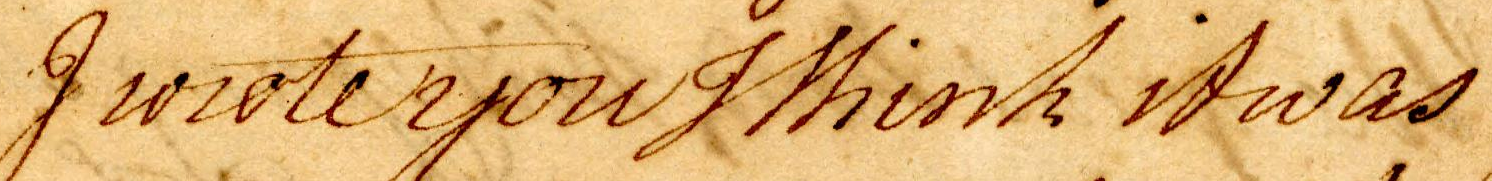I wrote you I think it was
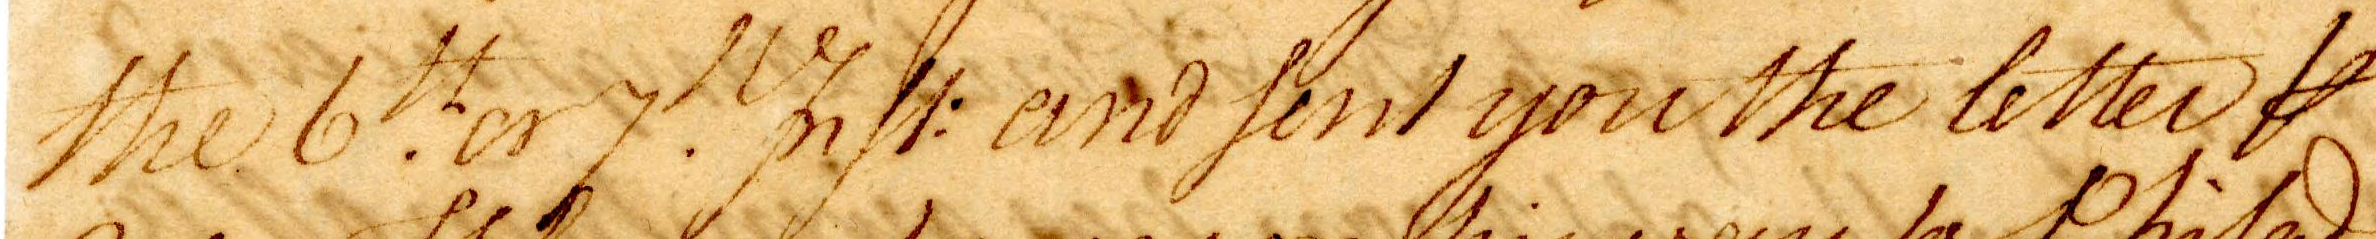the 6^th. or 7^th past and sent you the letter per
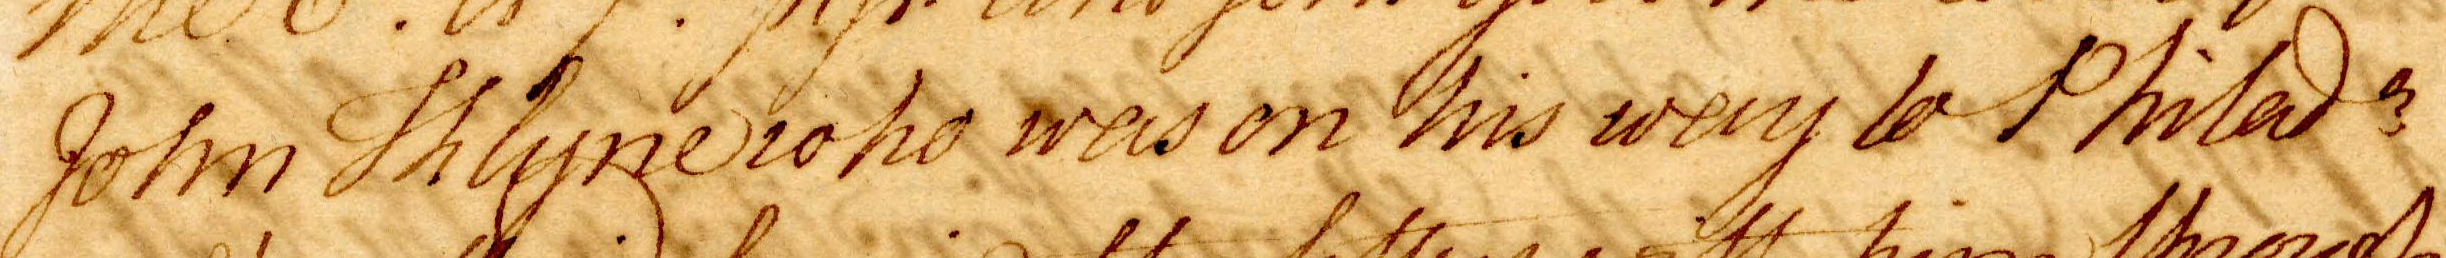John Thlyne who was on his way to Philad^a
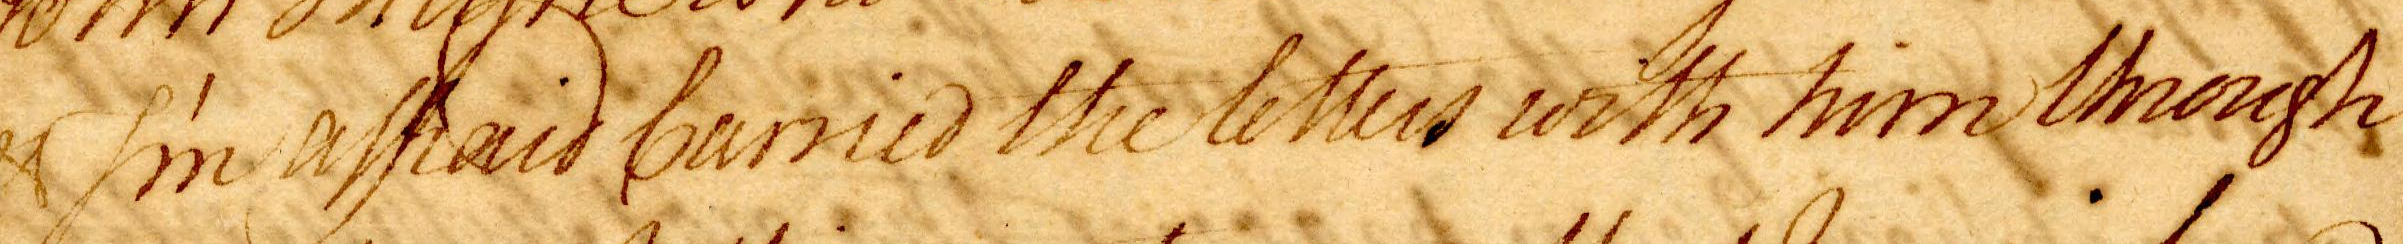& I'm afraid Carried the letters with him through
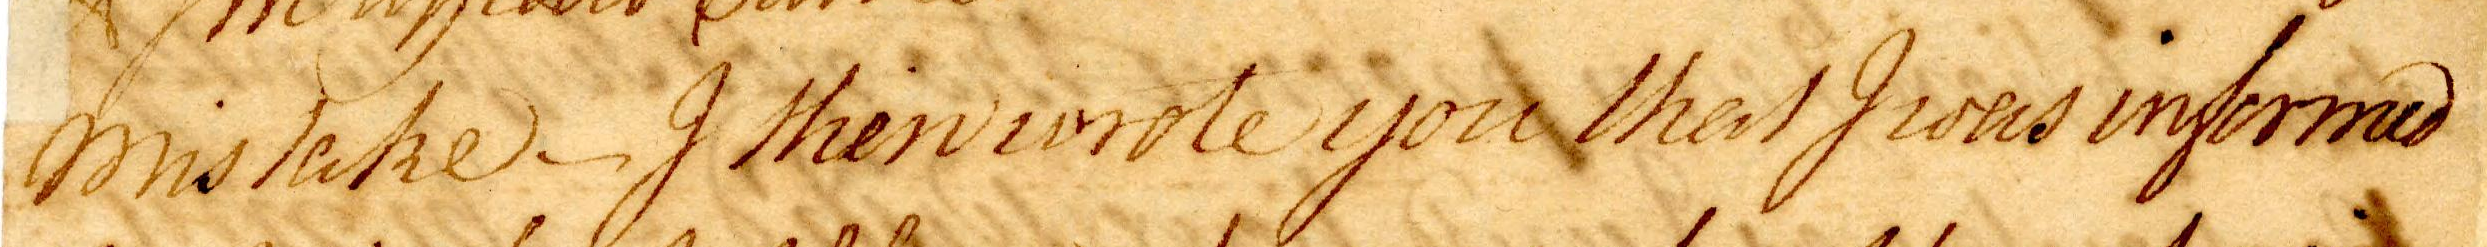Mistake- I then wrote you that I was informed
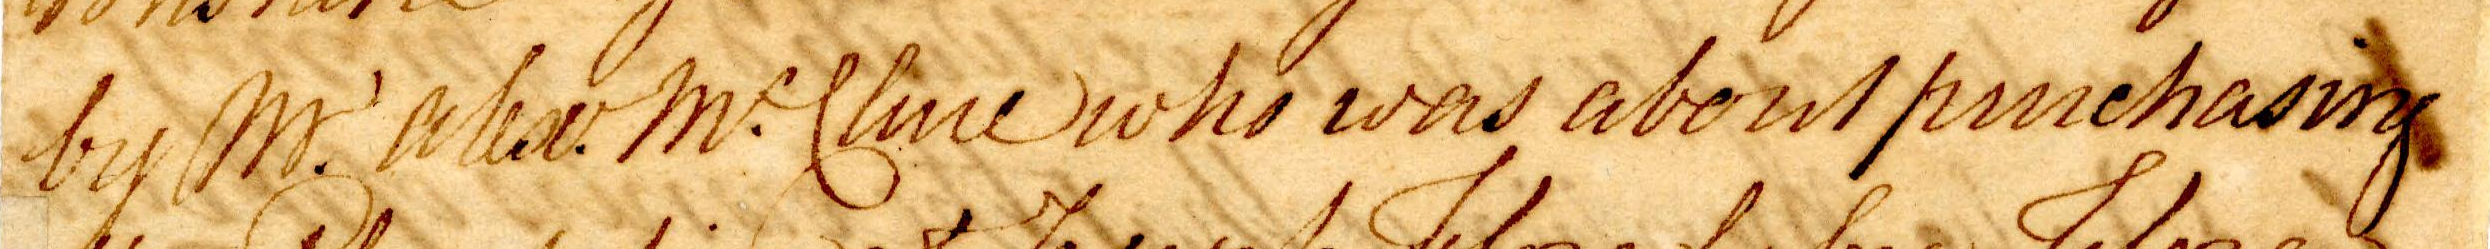by M^r Alex. M^cClune who was about purchasing
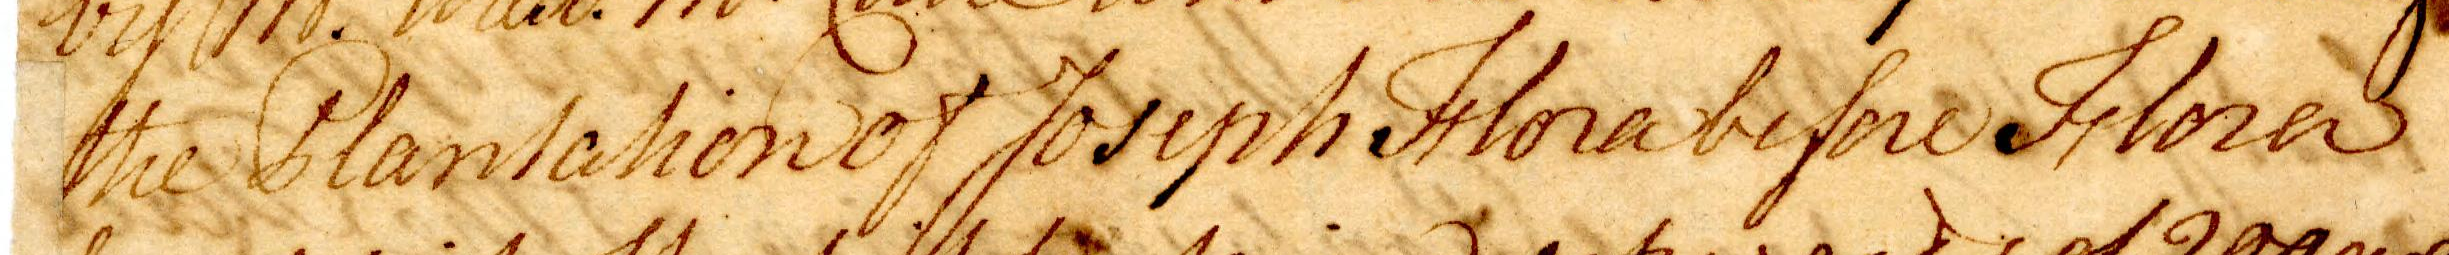the Plantation of Joseph Flora before Flora
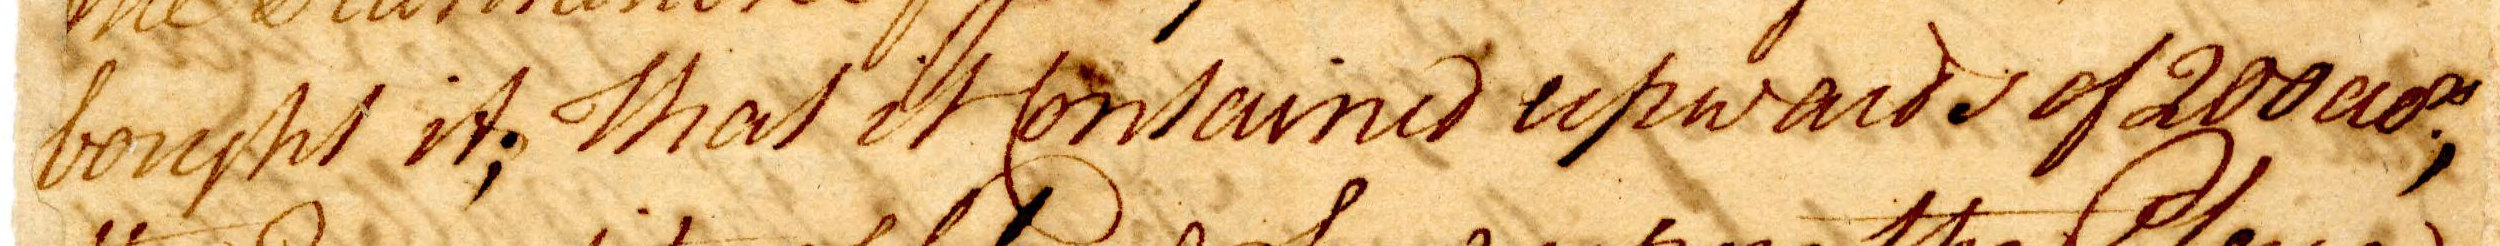bought it; that it Contained upwards of 200000;
